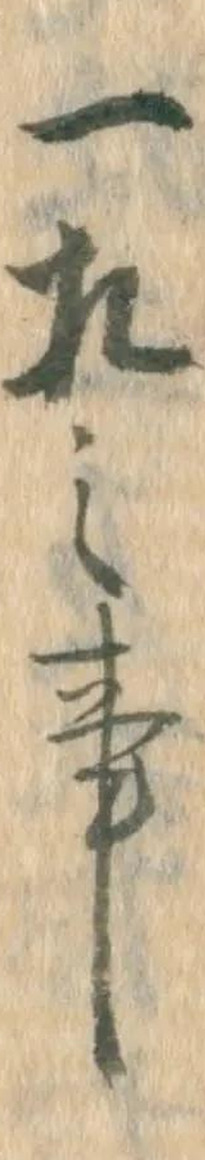一札之事
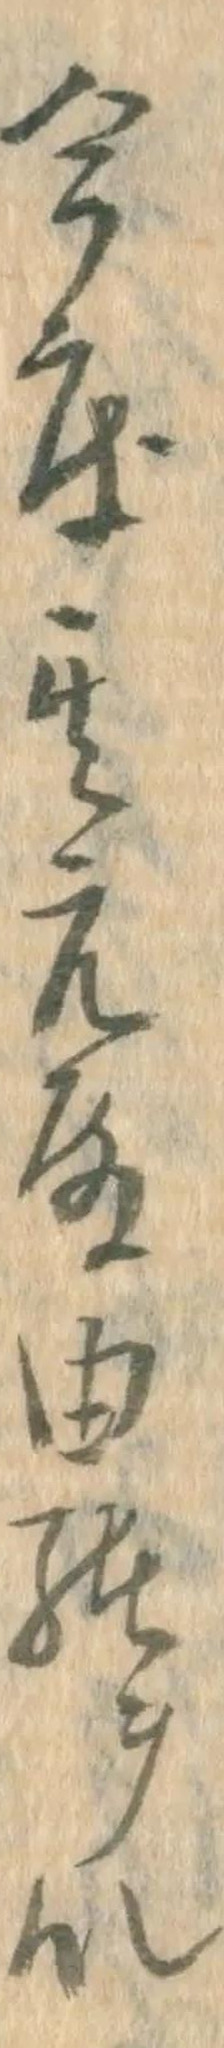今度其元殿由緒ヲ以
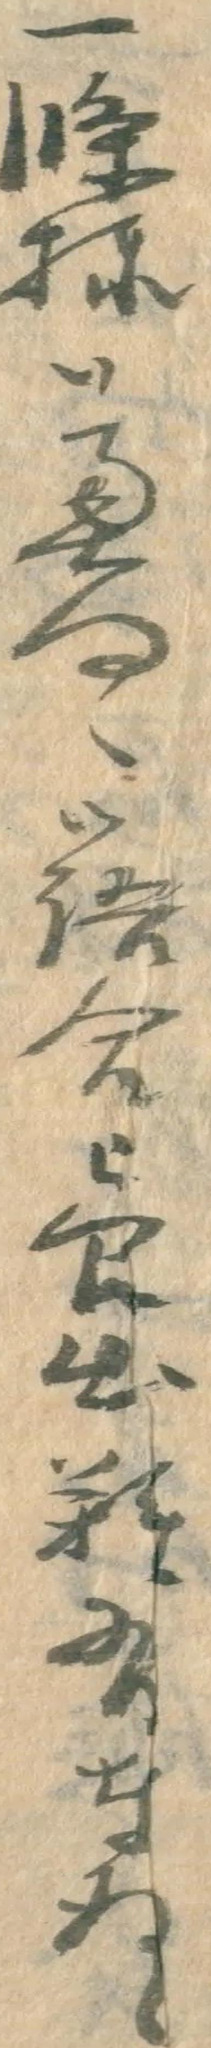一條様御奥向候ハ御詰合被召出難有奉存候、
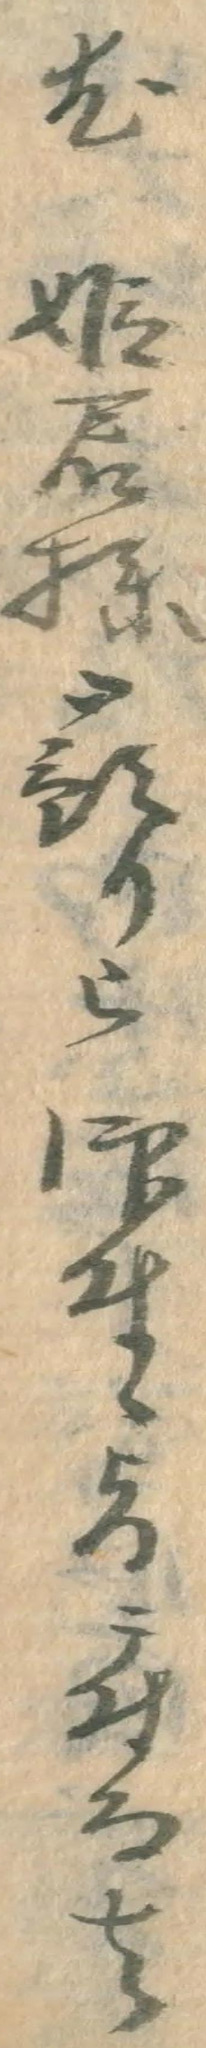尤姫君様御預り被仰付候旨ニ付而者、

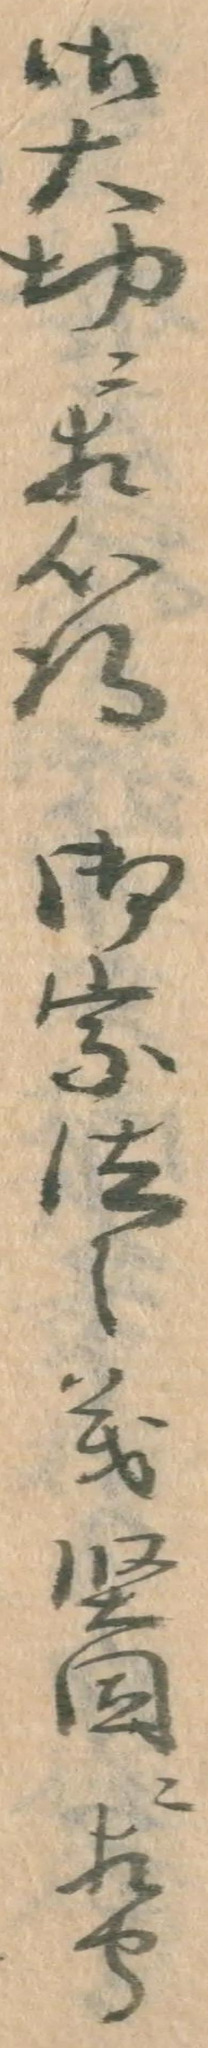御大切に相心得、御家法之義堅固に相守
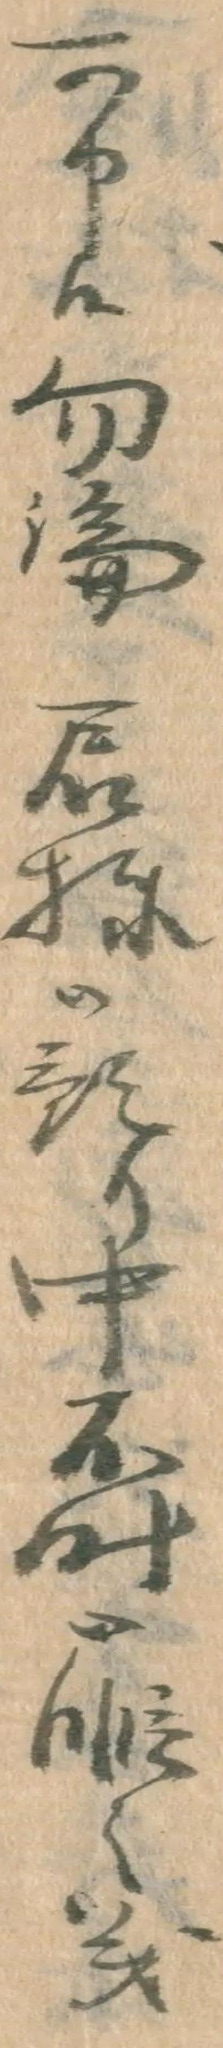可申候。勿論君様御預り中不叶御暇之義
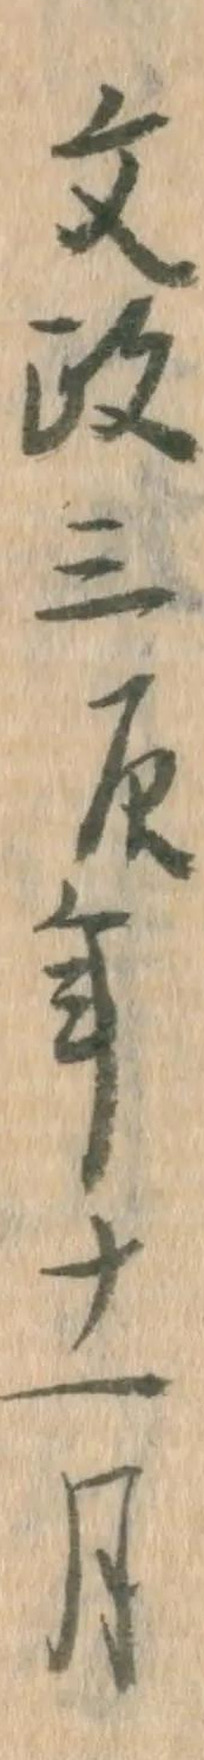文政三庚年十一月
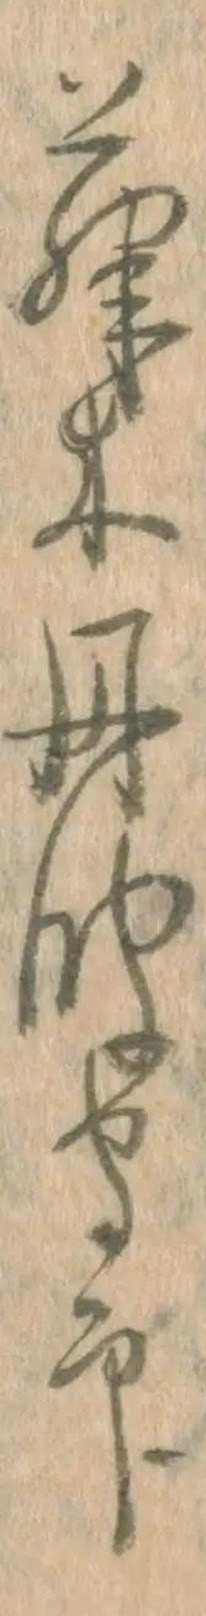藤木丹波守印
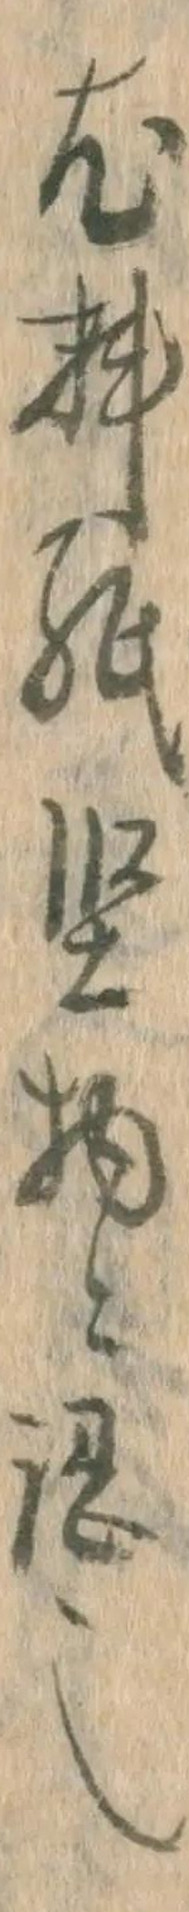尤料紙堅物と認也
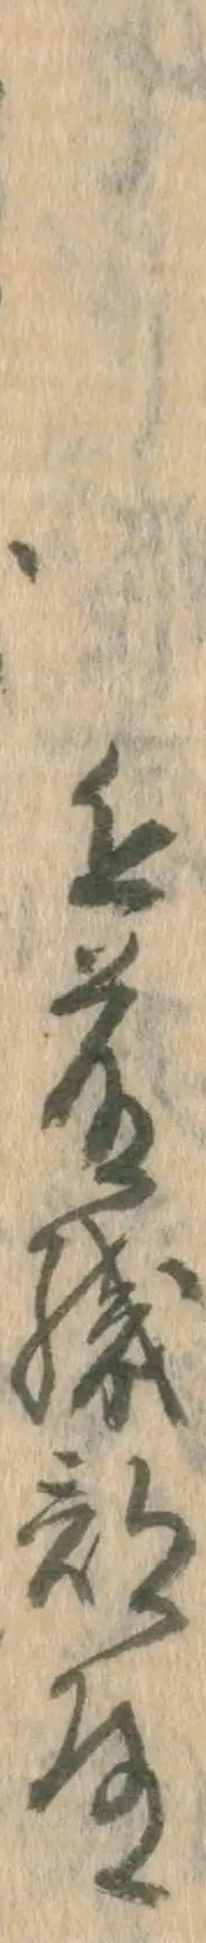近藤織部殿
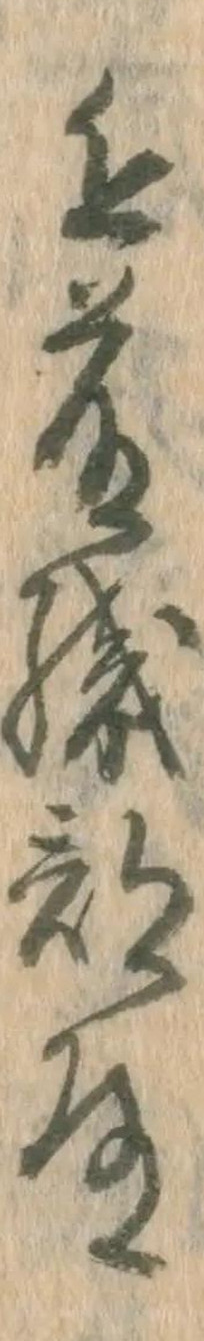近藤織部殿
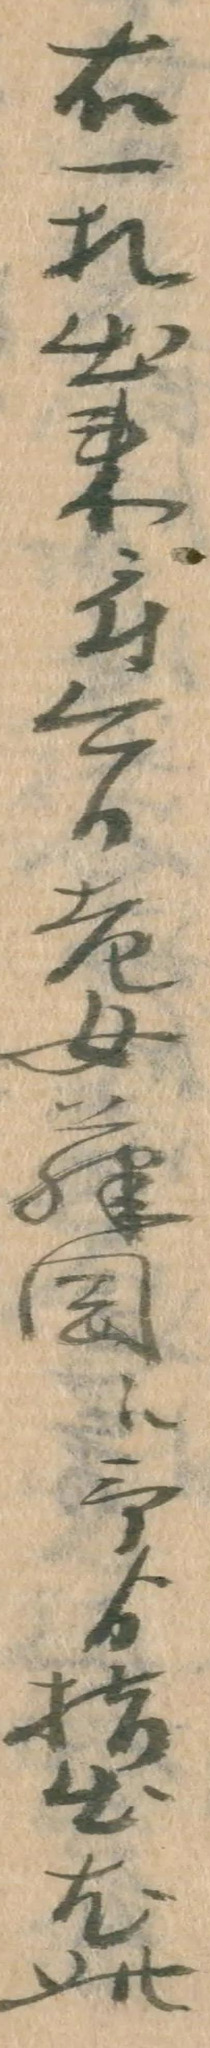右一札出来ニ付、今日老女藤岡え、予ゟ指出、尤此
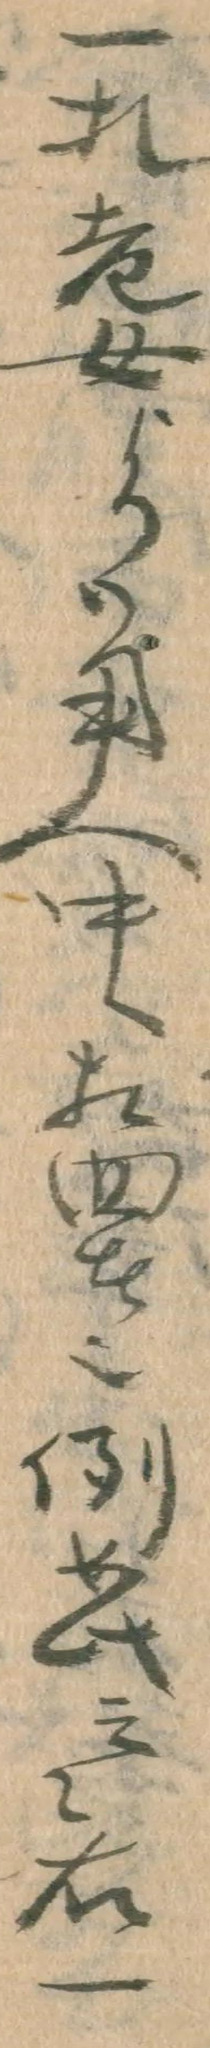一札老女より御用人中へ相回者也、例如此云々、右一
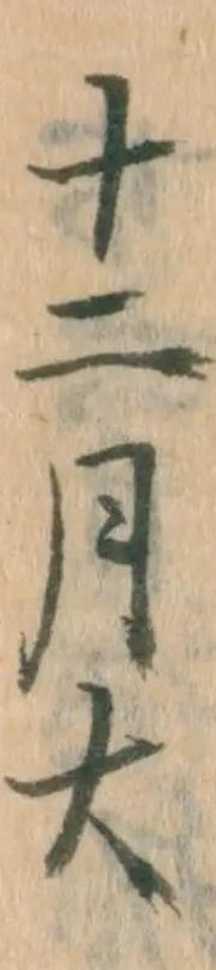十二月大
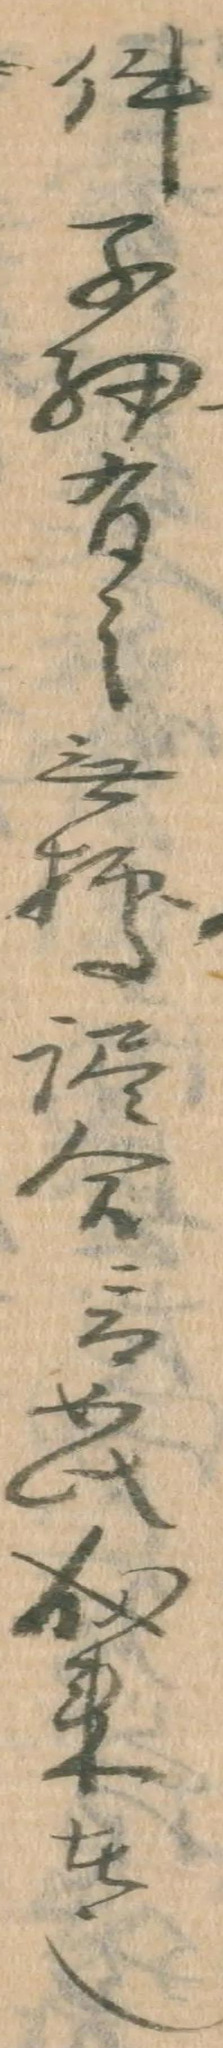件子細有之、無拠訳合ニ而如此成来者也、

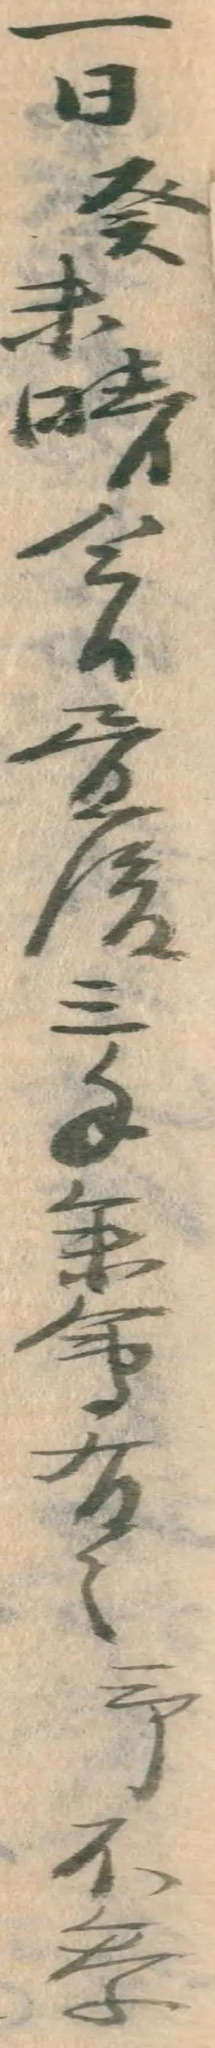一日癸未晴、今日昼後三手参會有之、予不参
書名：賀茂社記録. 第63冊
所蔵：国立国会図書館 National Diet Library, JAPAN
